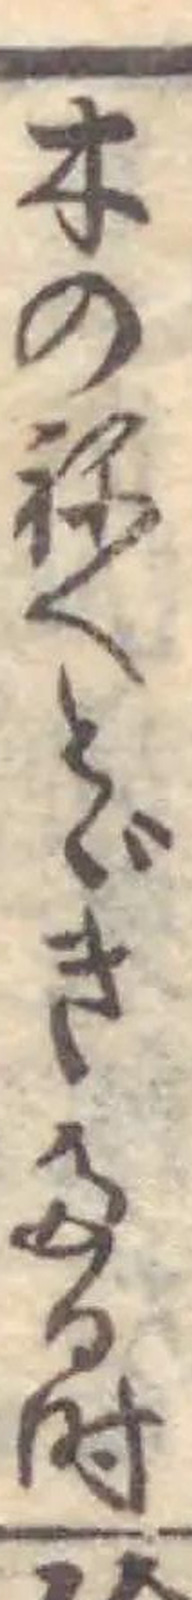木のねへとゞきたる時
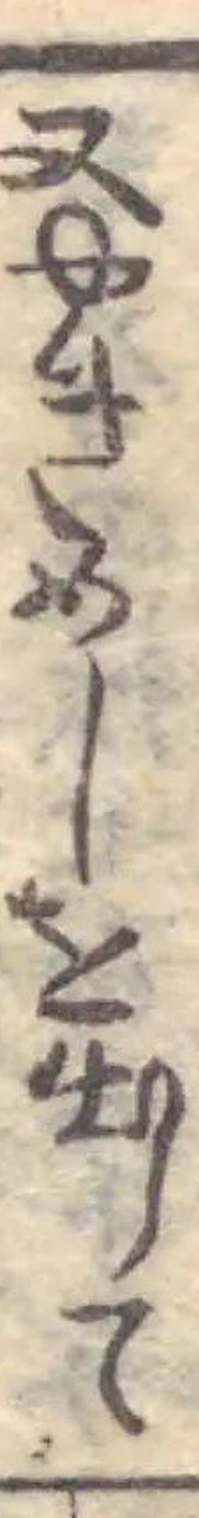又やきめしを出して
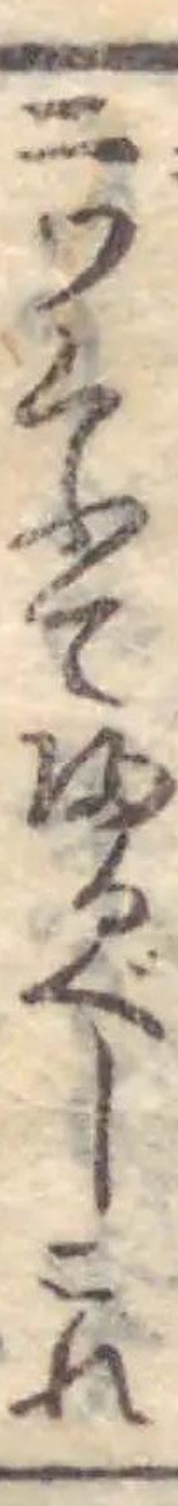二つくふて帰るべしこれ
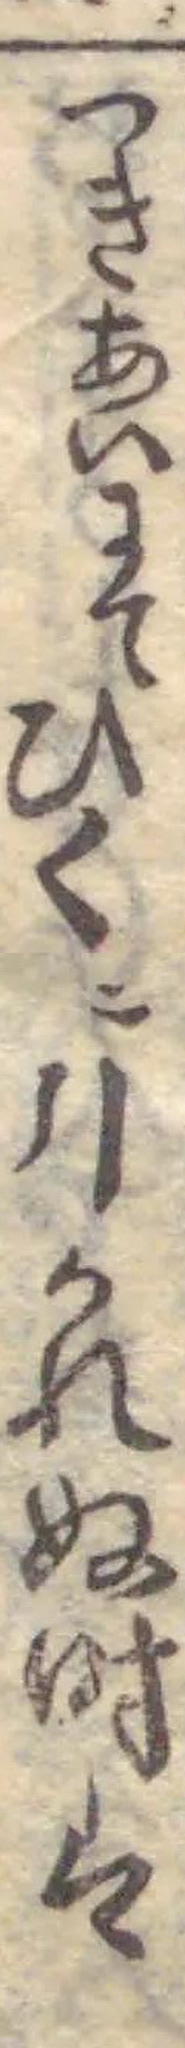つきあいにてひくに引かれぬ時は
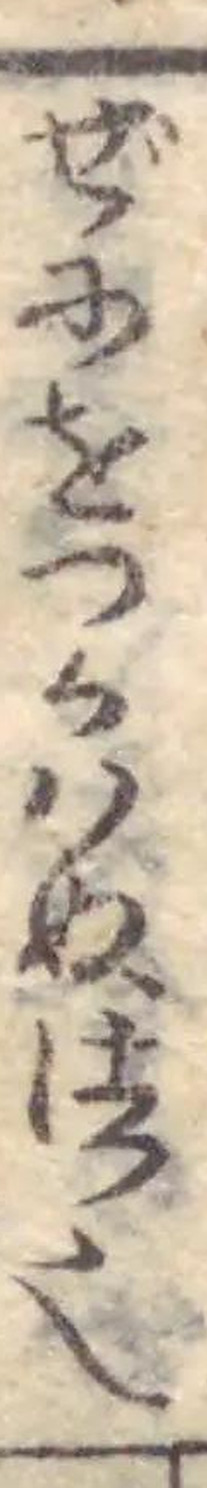ぜにをつかはぬ法也
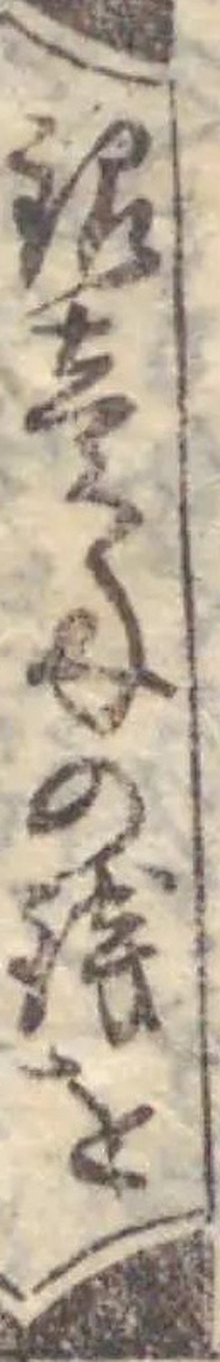『銀壱匁の銭を
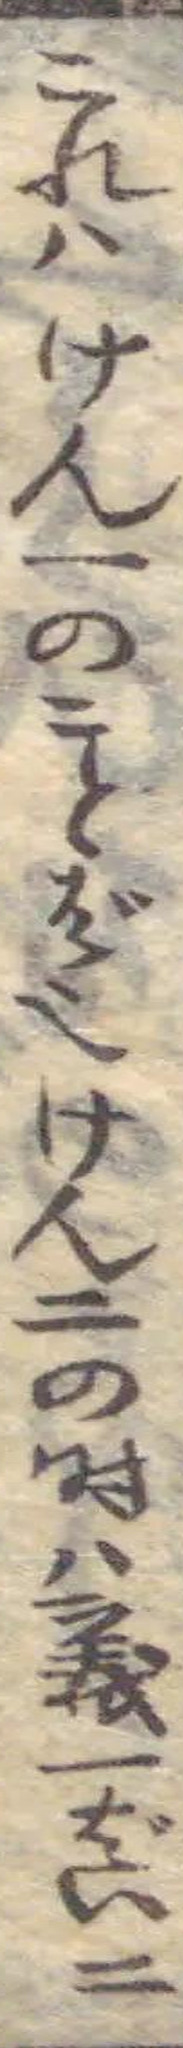これはけん一のことば也けん二の時は義一ばいに
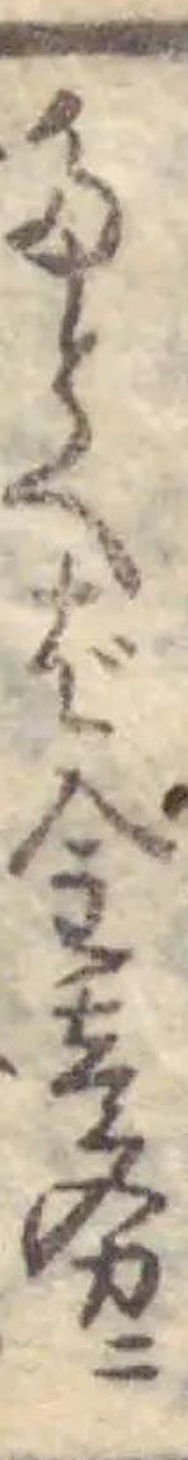たとへば金壱分に
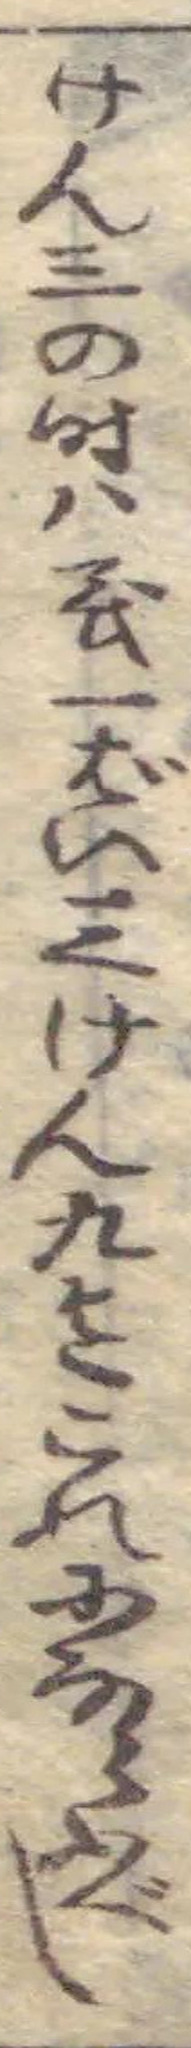けん三の時は義一ばい三けん九迄これにならふべし
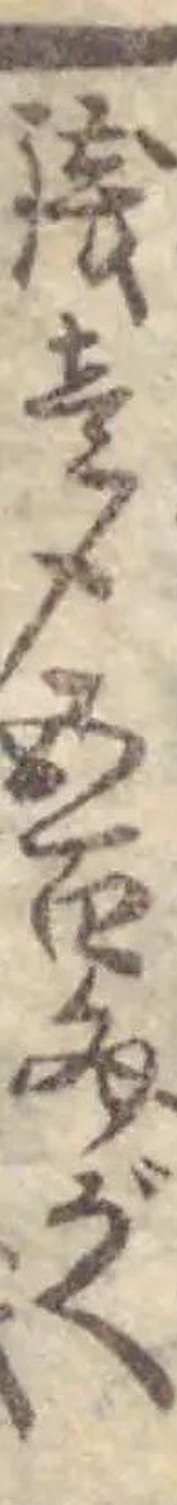銭壱貫五百文がへ
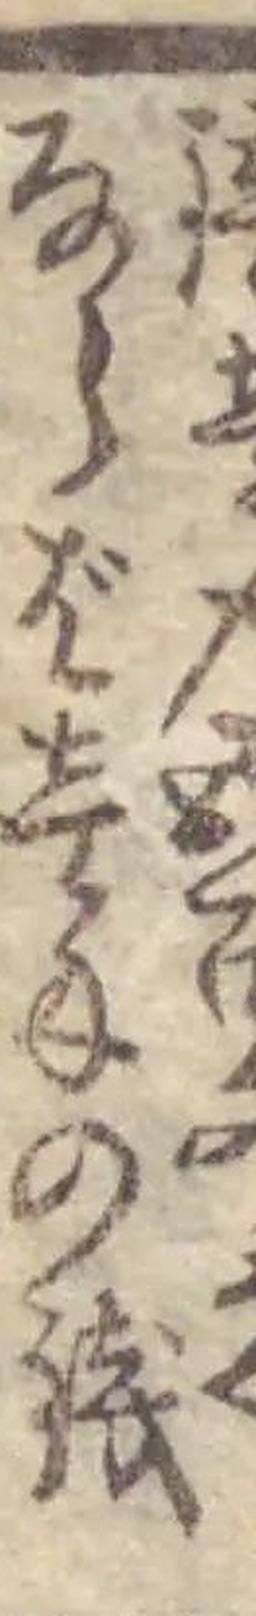ならば壱匁の銭
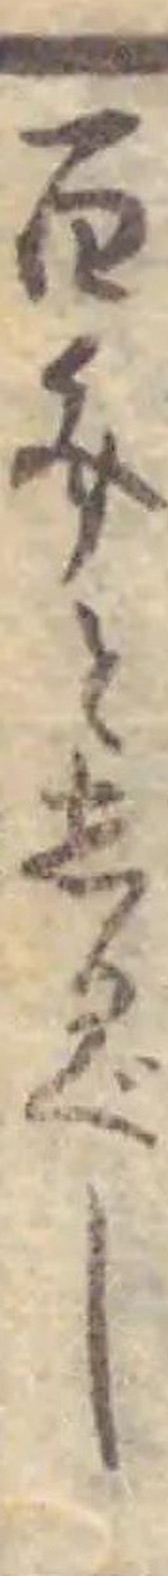百文としるべし

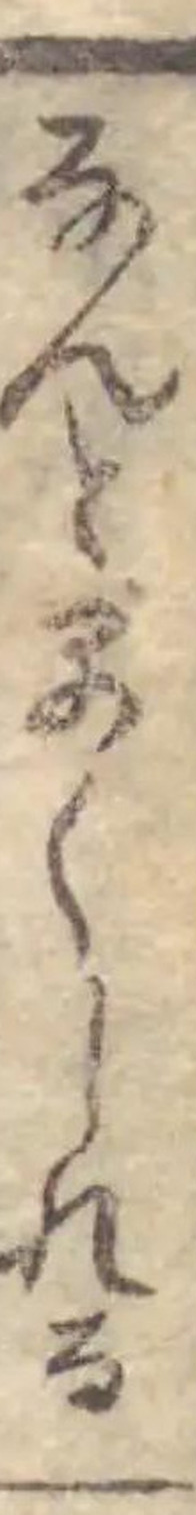なんと早くしれる
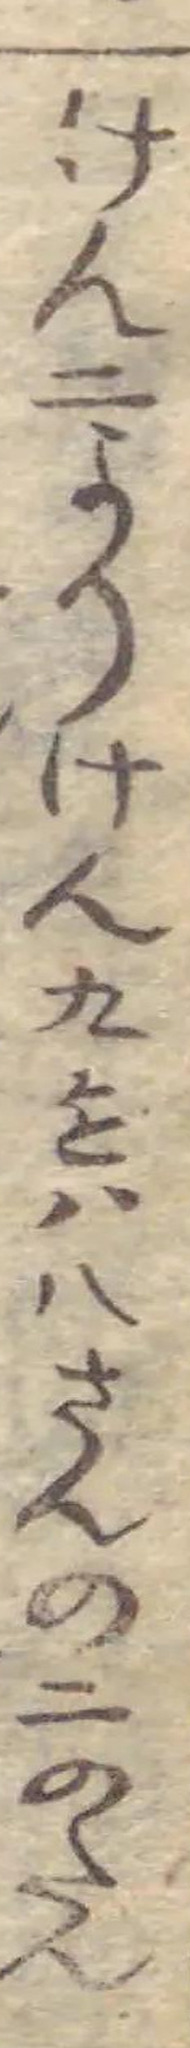けん二よりけん九をは八さんの二のたん
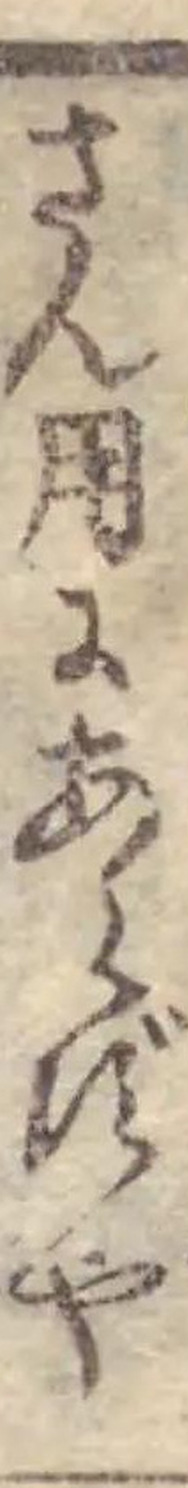さん用にあらずや
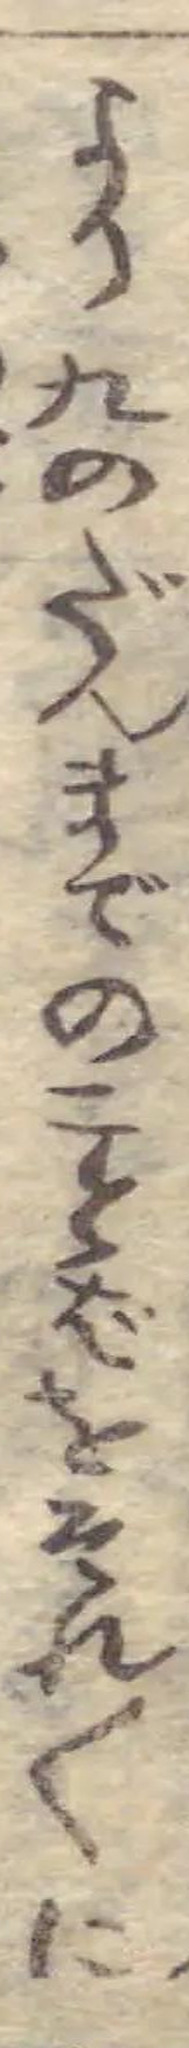より九のだんまでのことばをそれ〳〵に
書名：大通人好記
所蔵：国立国会図書館 National Diet Library, JAPAN
